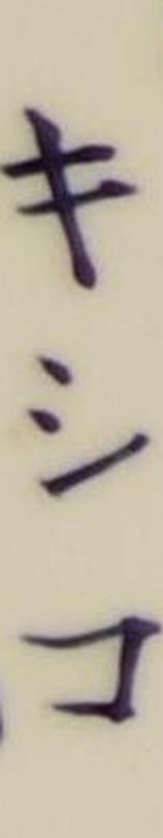キシコ
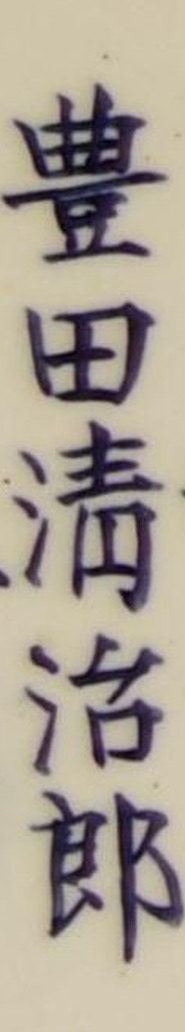豊田清治郎
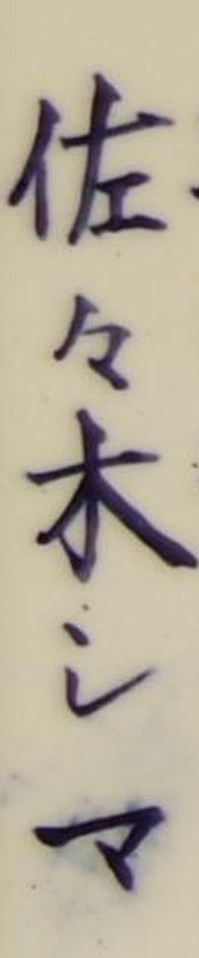佐々木シマ

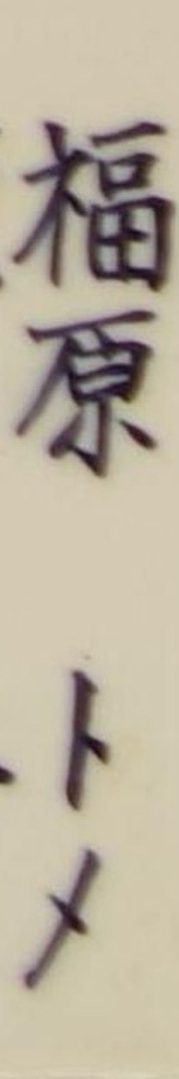福原トメ
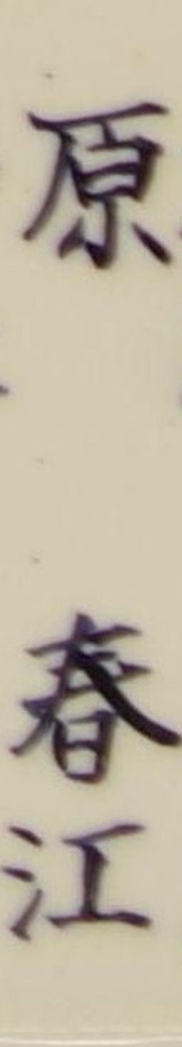原春江
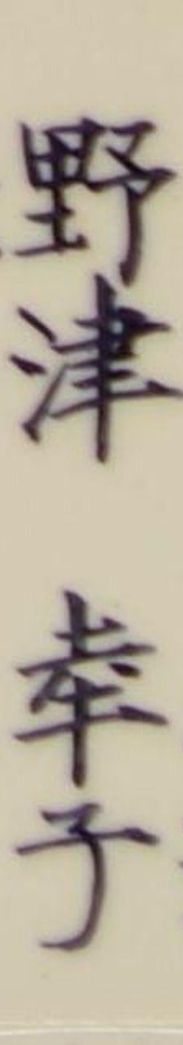野津幸子
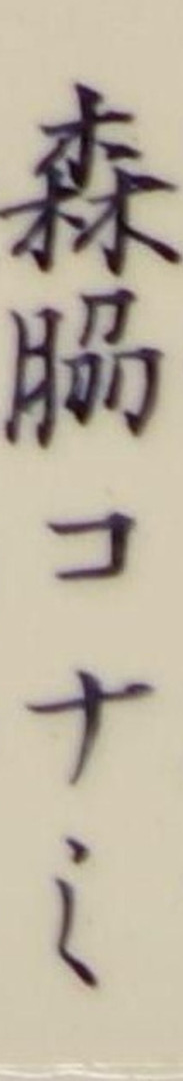森脇コナミ
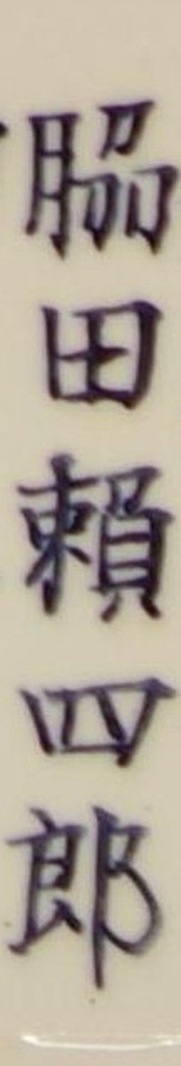脇田頼四郎
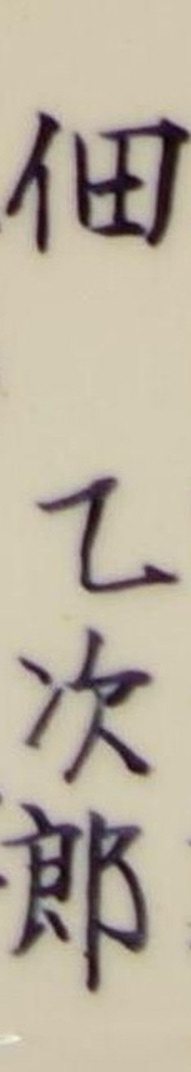佃乙次郎
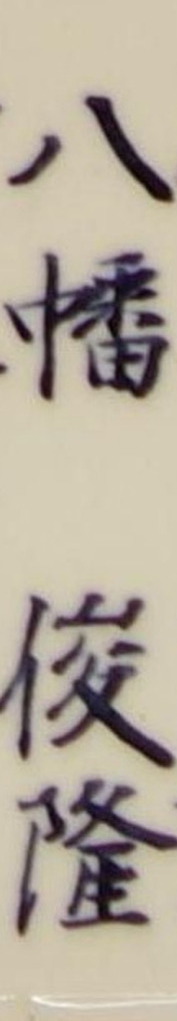八幡俊隆
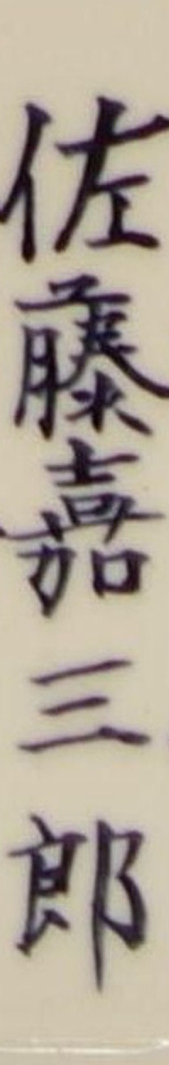佐藤嘉三郎
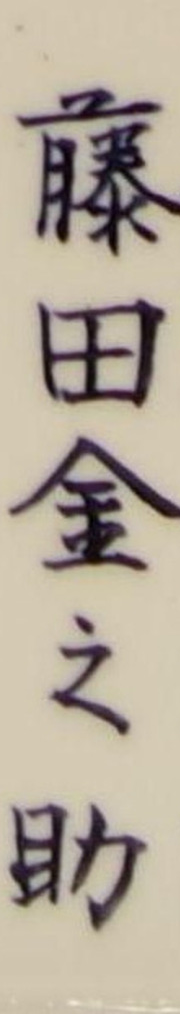藤田金之助
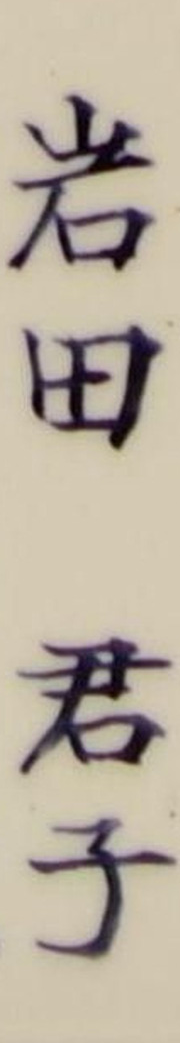岩田君子
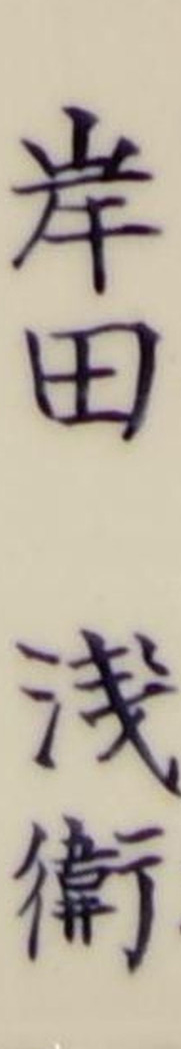岸田浅衡
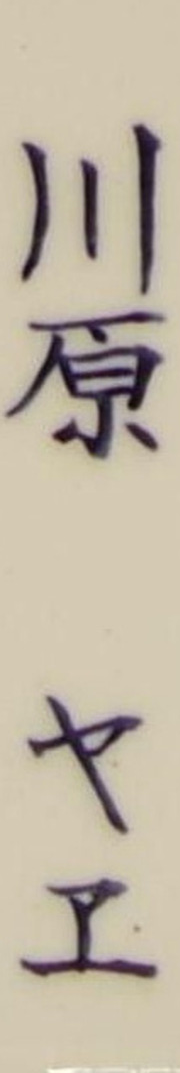川原ヤエ
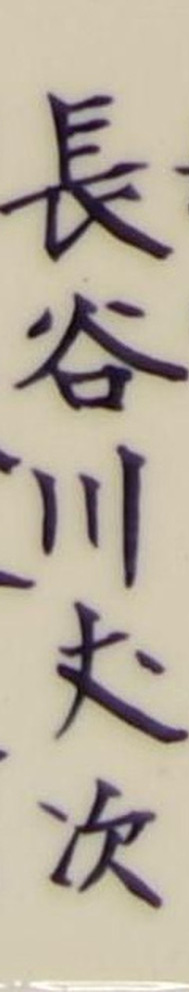長谷川丈次
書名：E~L
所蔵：高野山金剛峯寺
